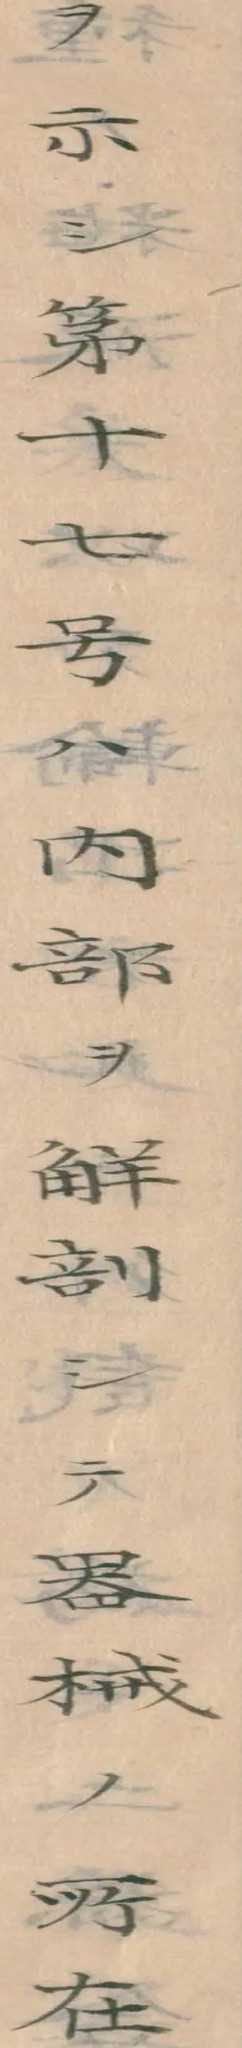ヲ示シ第十七号ハ内部ヲ解剖シテ器械ノ所在
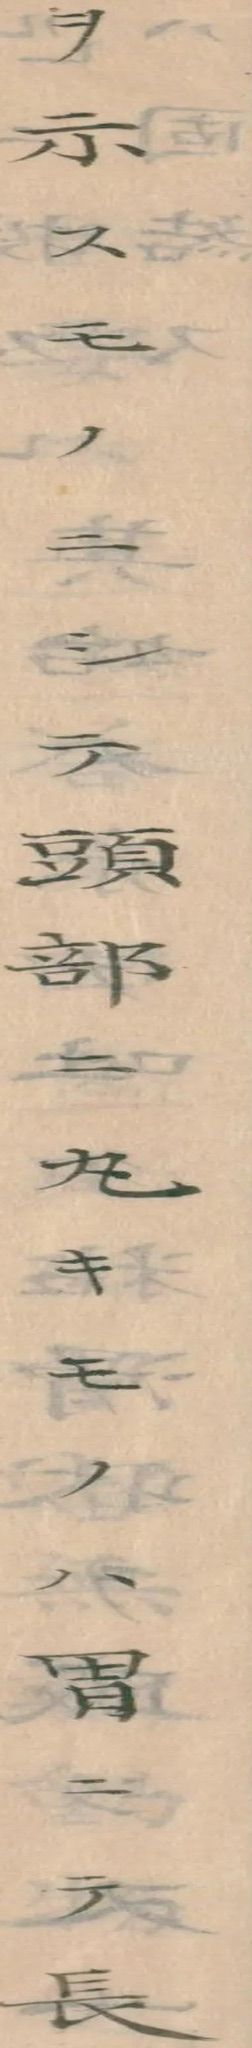ヲ示スモノニシテ頭部ニ丸キモノハ胃ニテ長
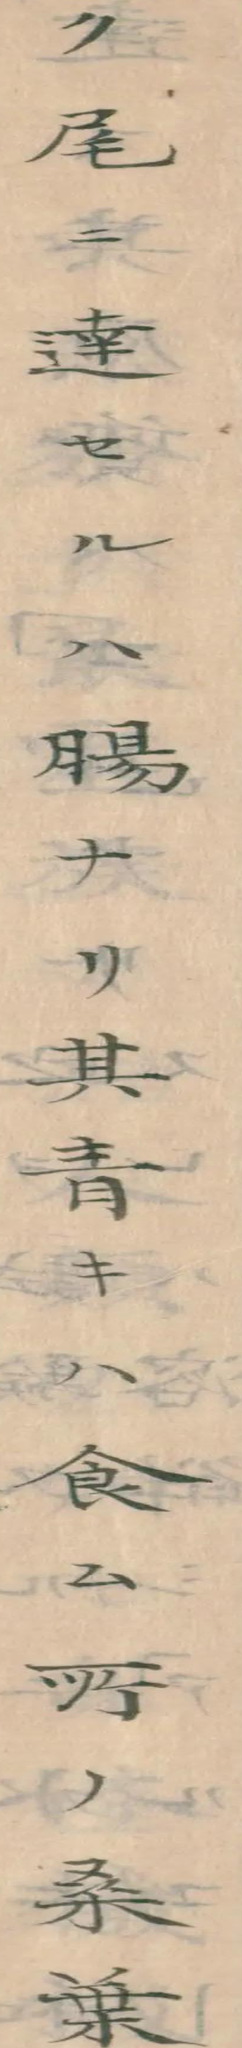ク尾ニ達セルハ腸ナリ其青キハ食ム所ノ桑葉
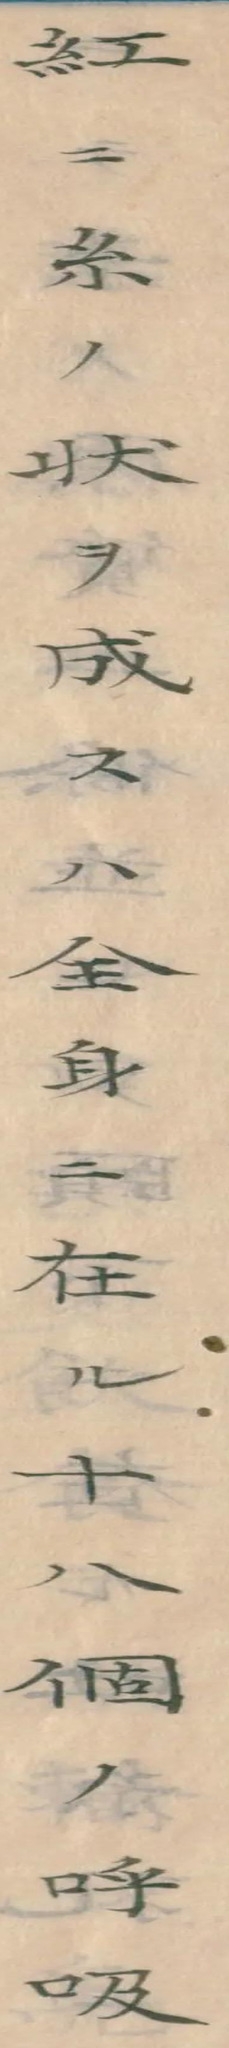紅ニ糸ノ状ヲ成スハ全身ニ在ル十八個ノ呼吸
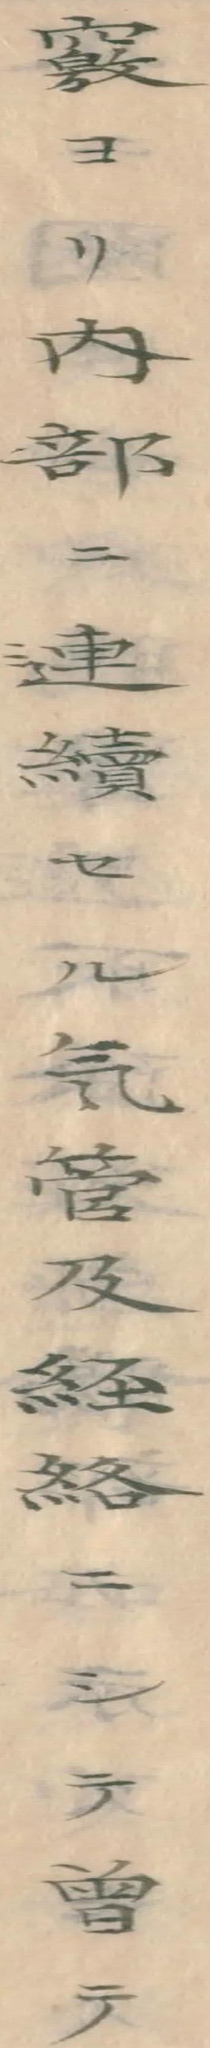竅ヨリ内部ニ連続セル気管及経絡ニシテ曽テ
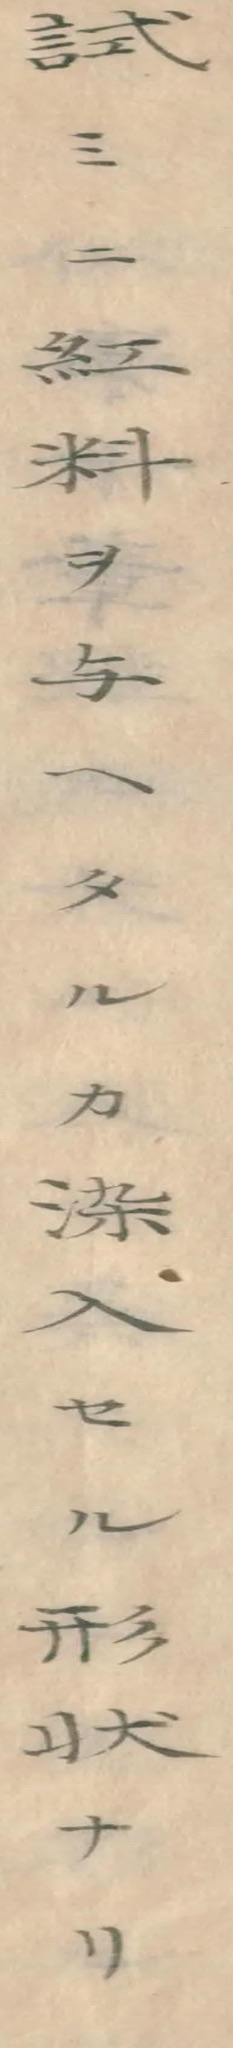試ミニ紅料ヲ与ヘタルカ染入セル形状ナリ
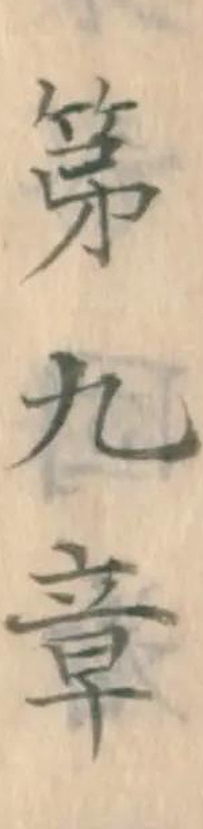第九章
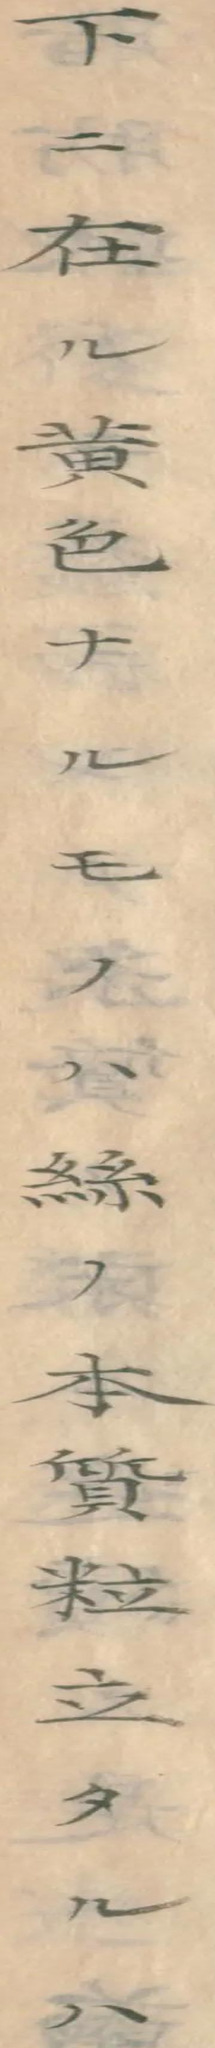下ニ在ル黄色ナルモノハ糸ノ本質粒立タルハ

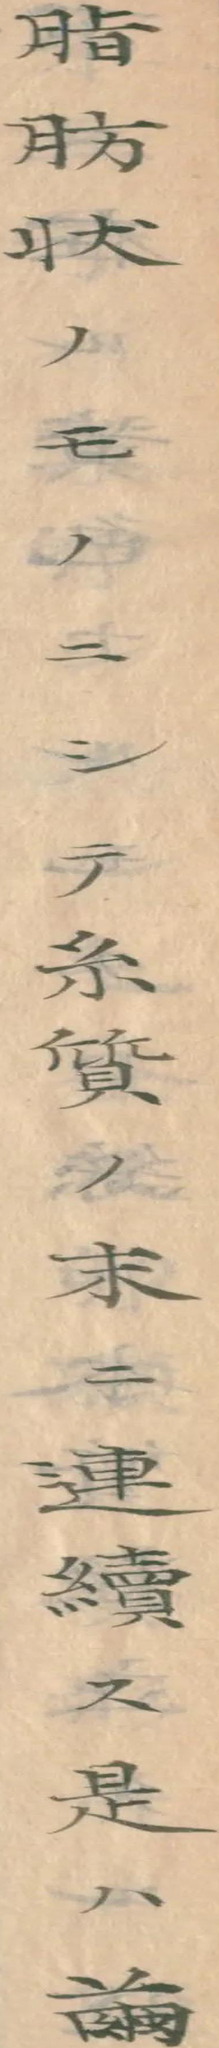脂肪状ノモノニシテ糸質ノ末ニ連続ス是ハ繭
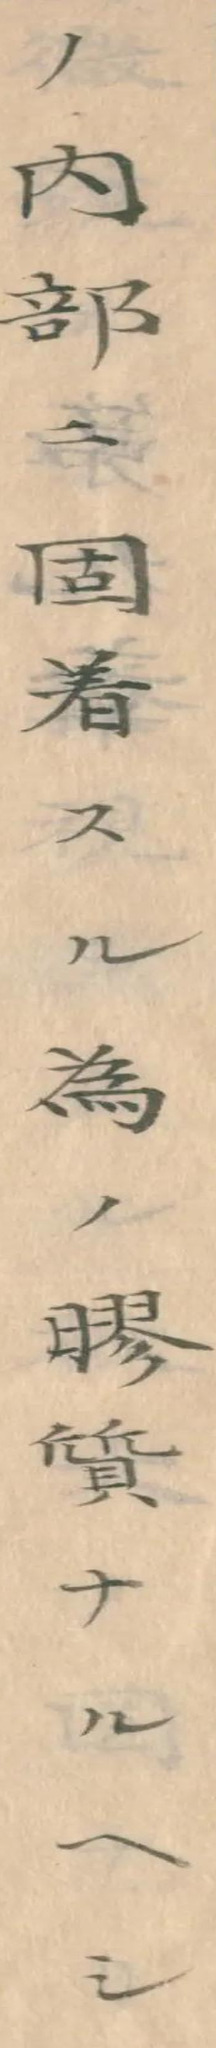ノ内部ニ固着スル為ノ膠質ナルヘシ
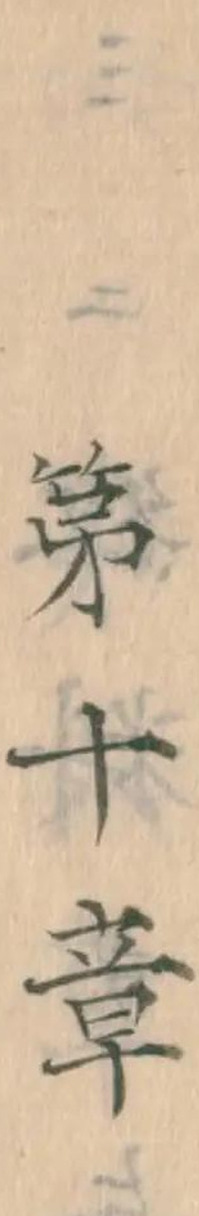第十章
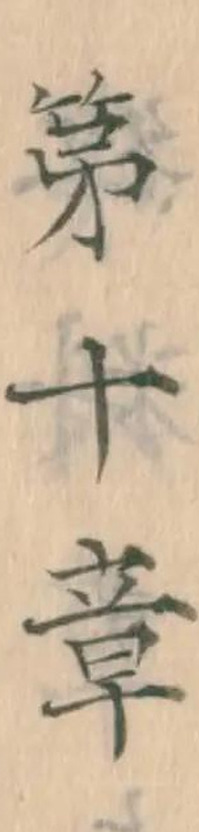第十章
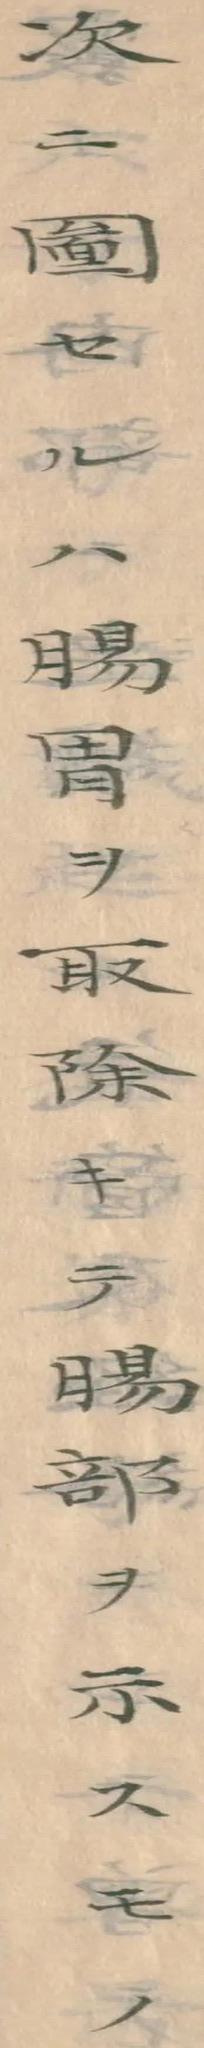次ニ図セルハ腸胃ヲ取除キテ腸部ヲ示スモノ
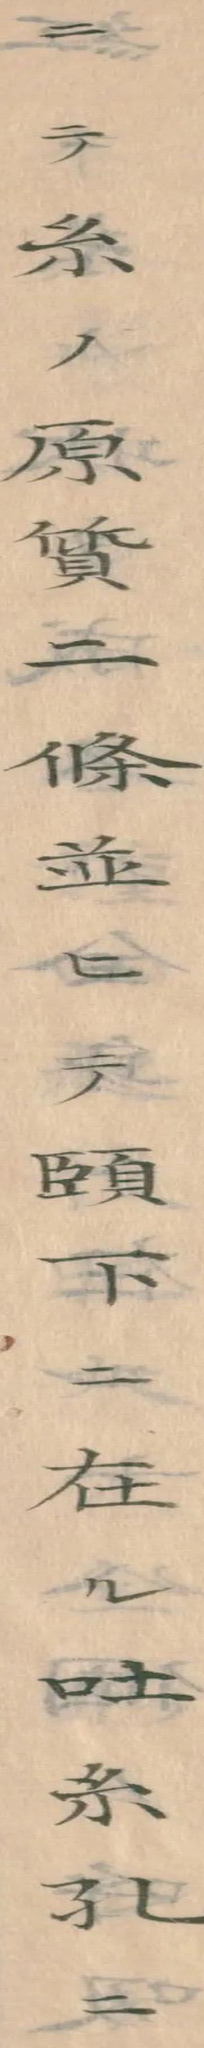ニテ糸ノ原質二条並ヒテ頤下ニ在ル吐糸孔ニ
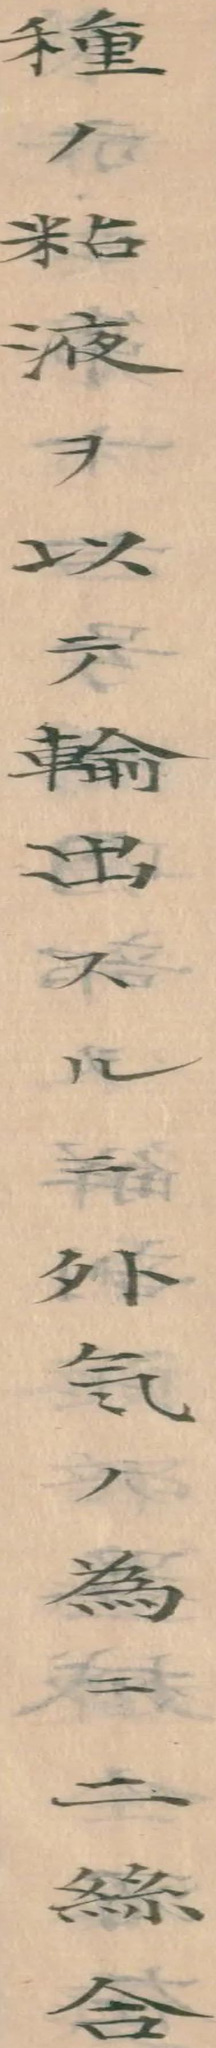種ノ粘液ヲ以テ輸出スルニ外気ノ為ニ二糸合
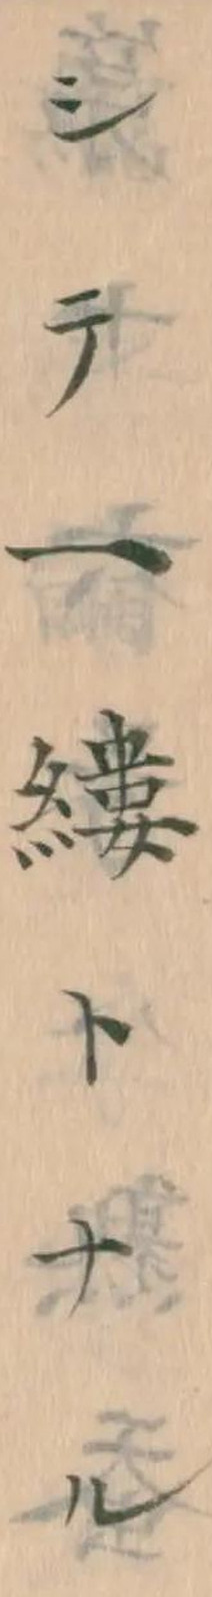シテ一縷トナル
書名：蚕桑集成
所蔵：国立国会図書館 National Diet Library, JAPAN
